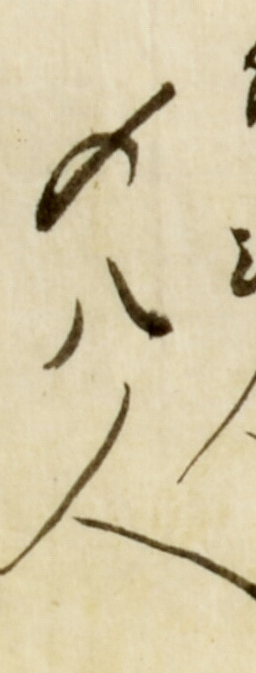〆八人
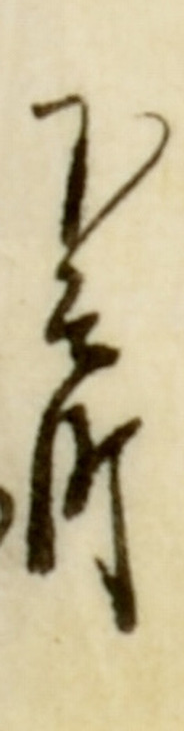下茂町

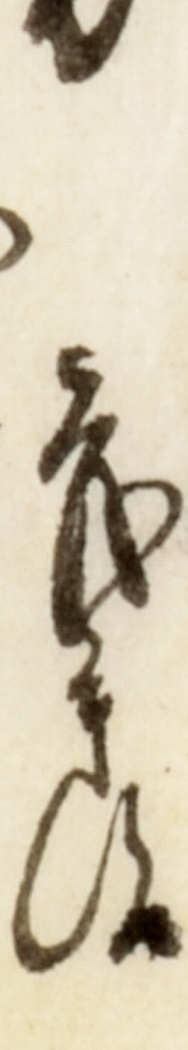彦兵衛
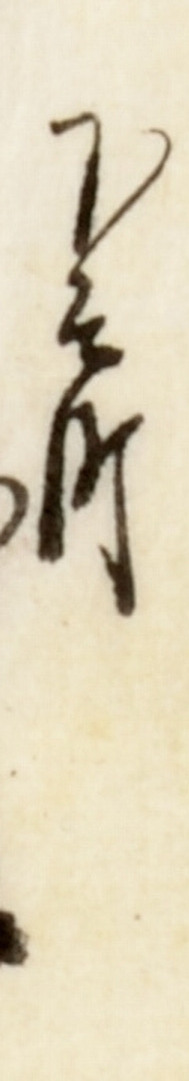彦兵衛
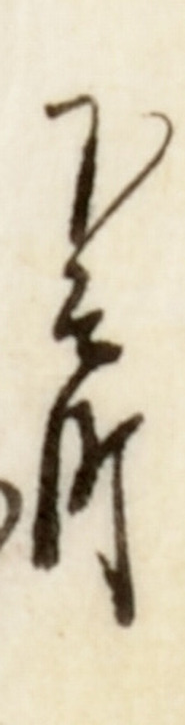彦兵衛
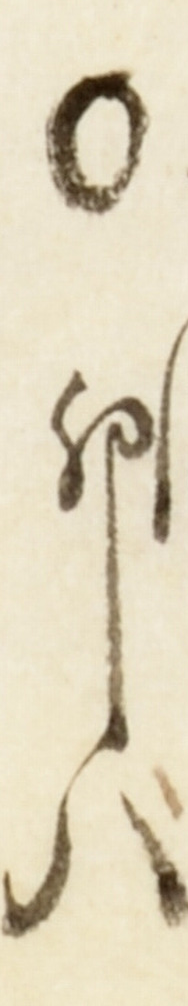○卯八
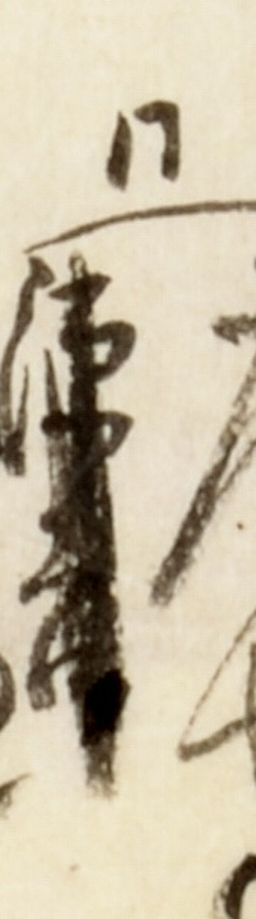彦兵衛
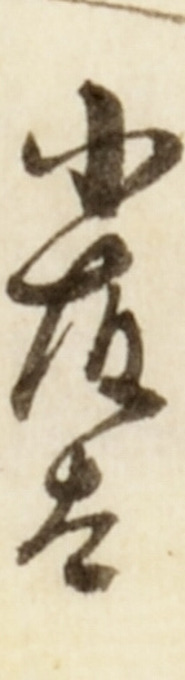小藤太
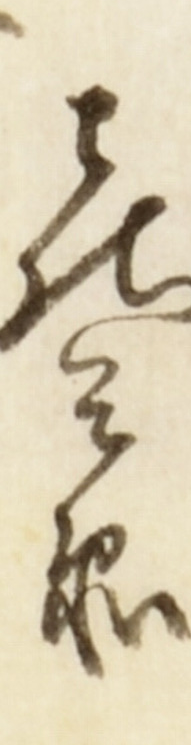彦兵衛
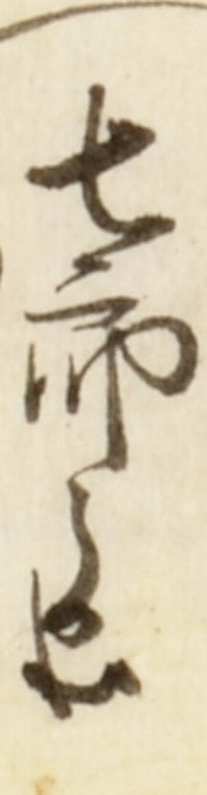七郎兵衛
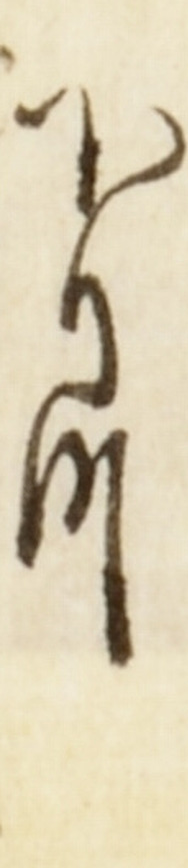下モ町
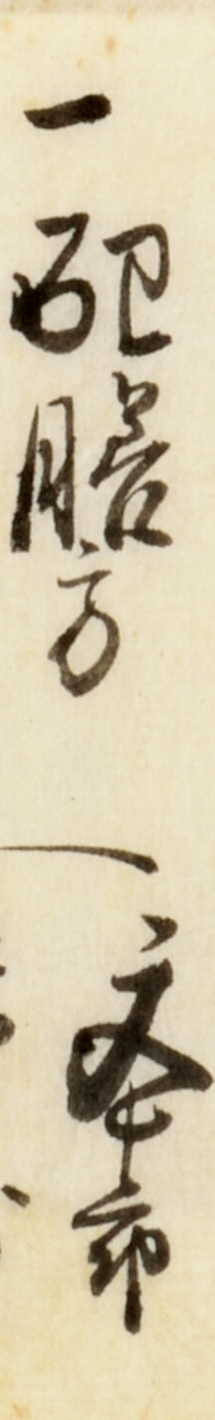一配膳方文十郎
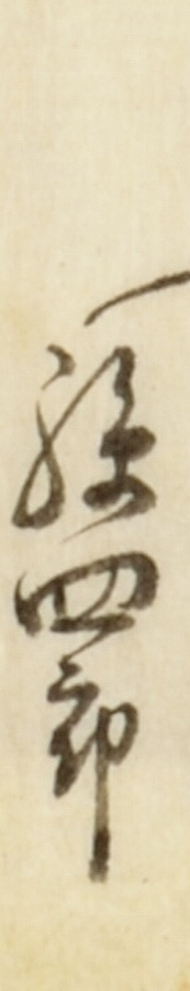孫四郎
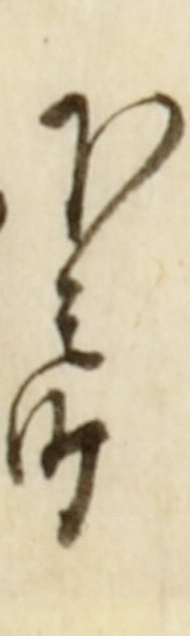下モ町
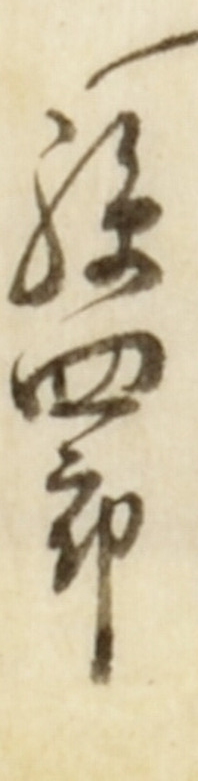孫四郎
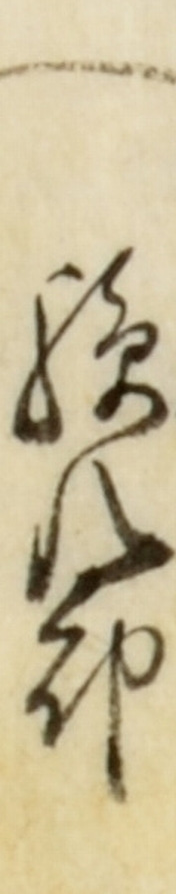孫四郎
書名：役配人足割合帳
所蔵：伊那市立高遠町図書館・合同会社AMANE
